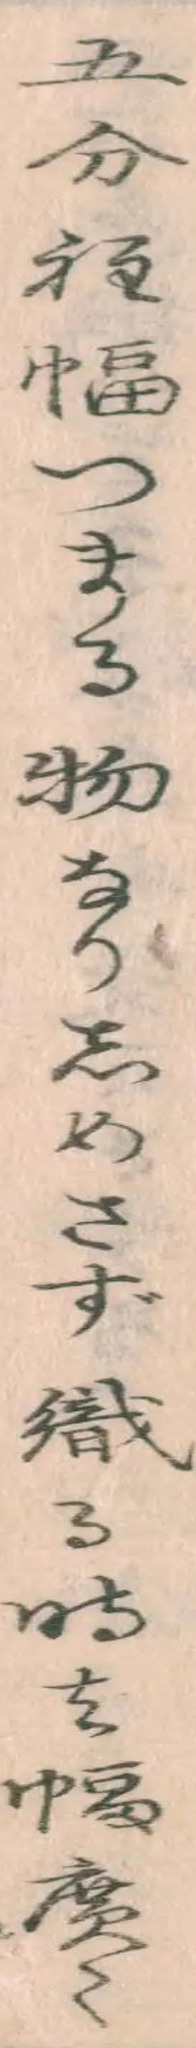五分程幅つまる物なりしめさず織る時は幅広く
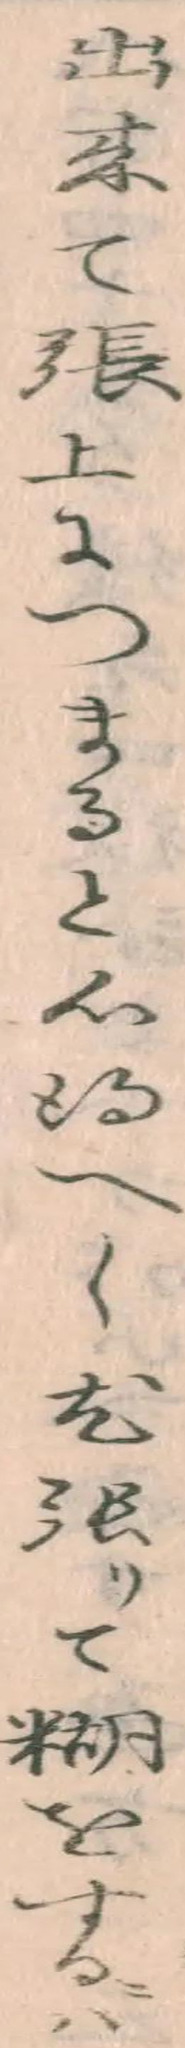出来て張上につまると心得へし尤張りて糊をするには
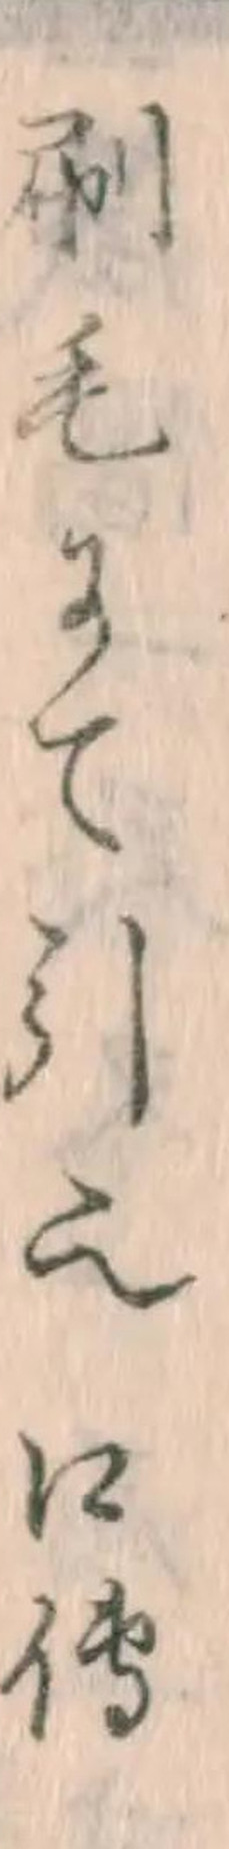刷毛にて引也口伝
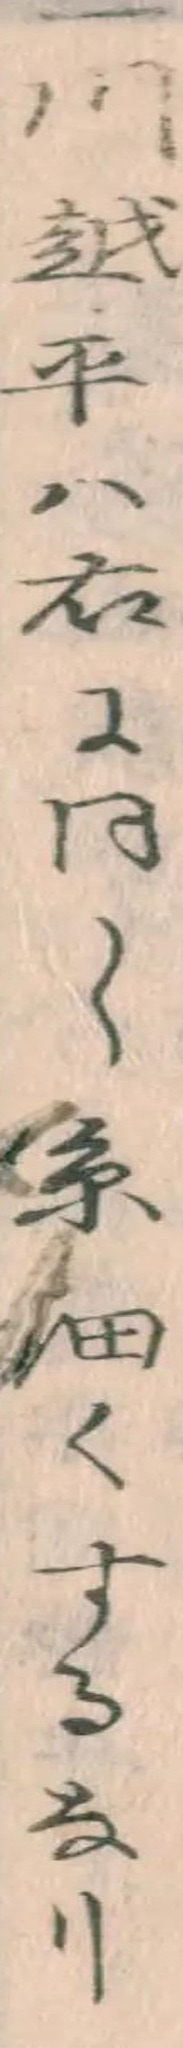一川越平は右に同し糸細くするなり
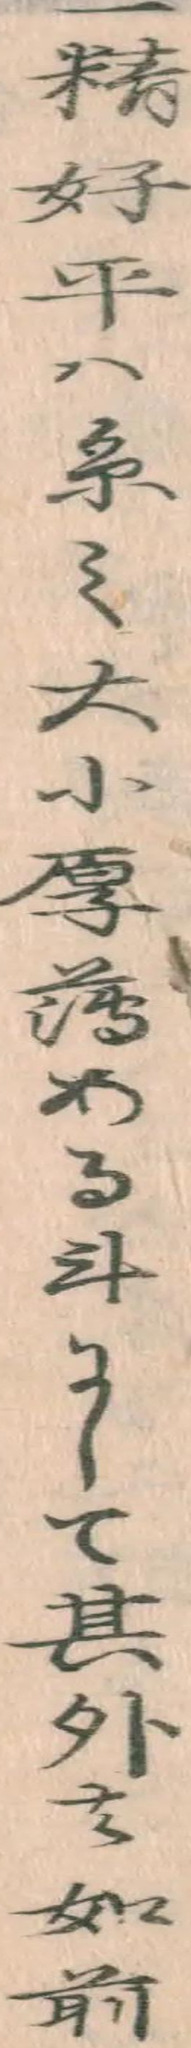一精好平は糸之大小厚薄ある斗にして其外は如前
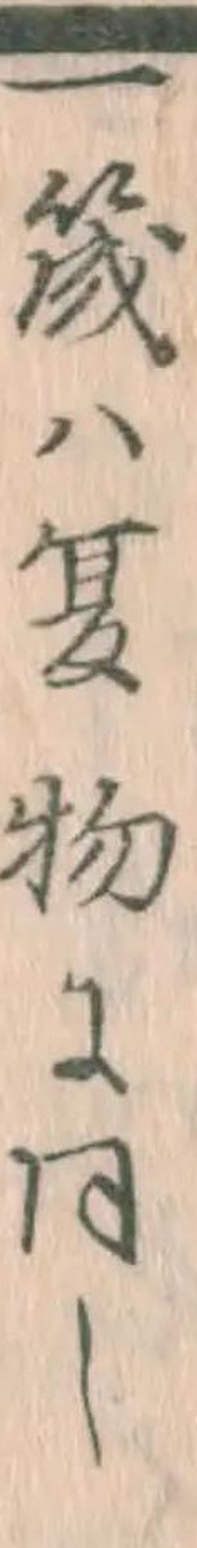一筬は夏物に同し
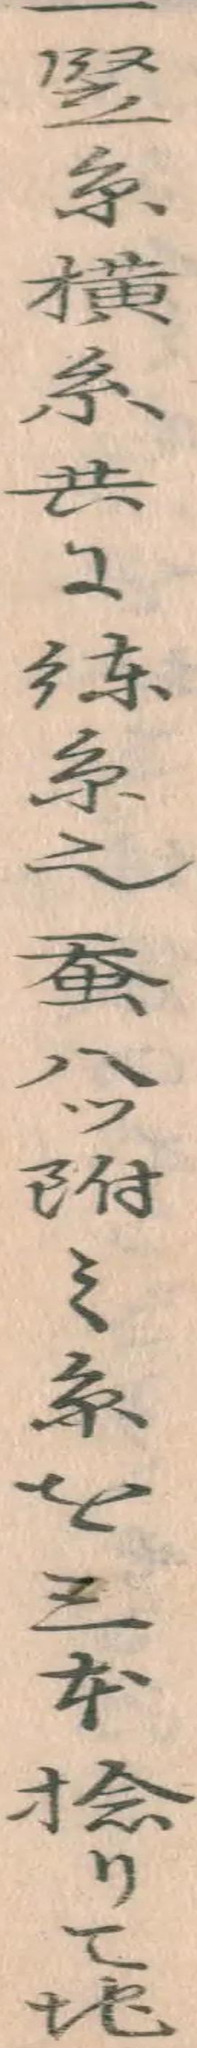一竪糸横糸共に練糸也蚕八ッ附之糸を三本捻りて地
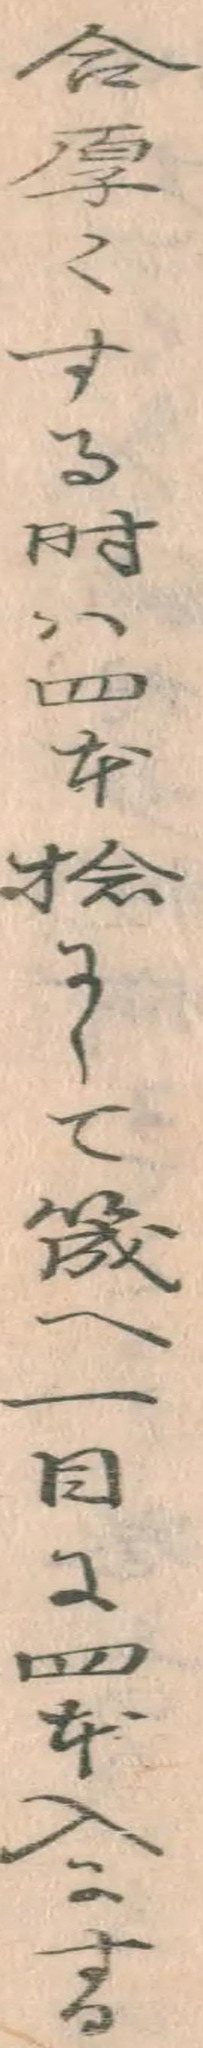合厚くする時は四本捻にして筬へ一目に四本入にする
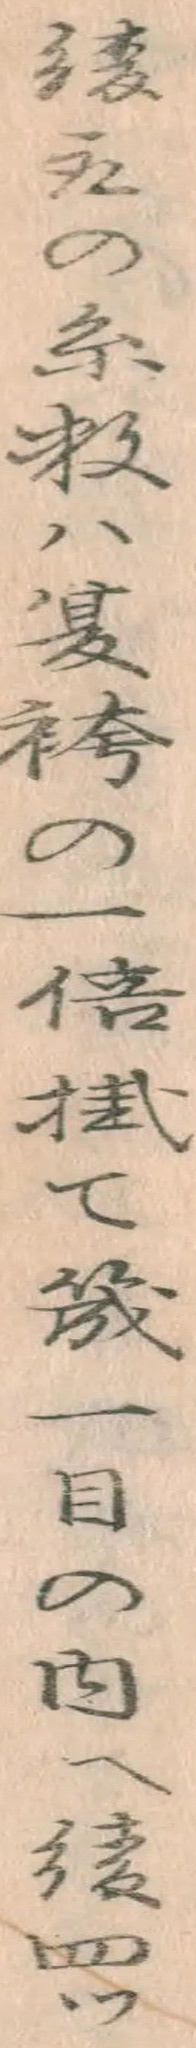綾取の糸数は夏袴の一倍掛て筬一目の内へ綾四ッ
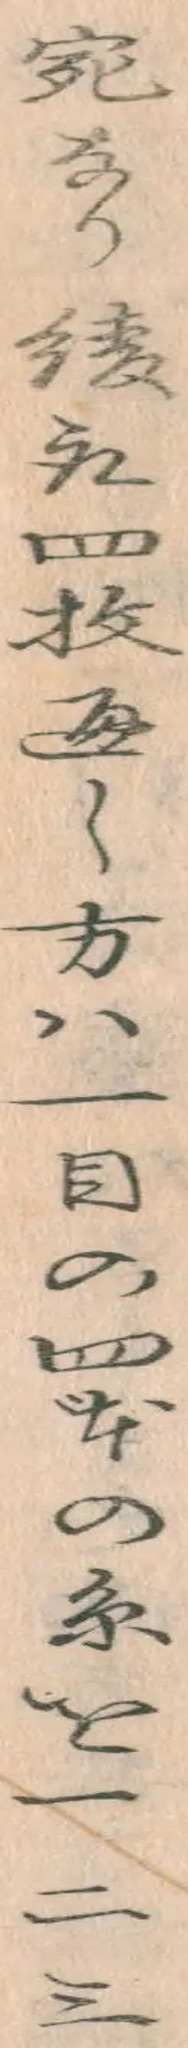宛なり綾取四枚通し方は一目の四本の糸を一二三
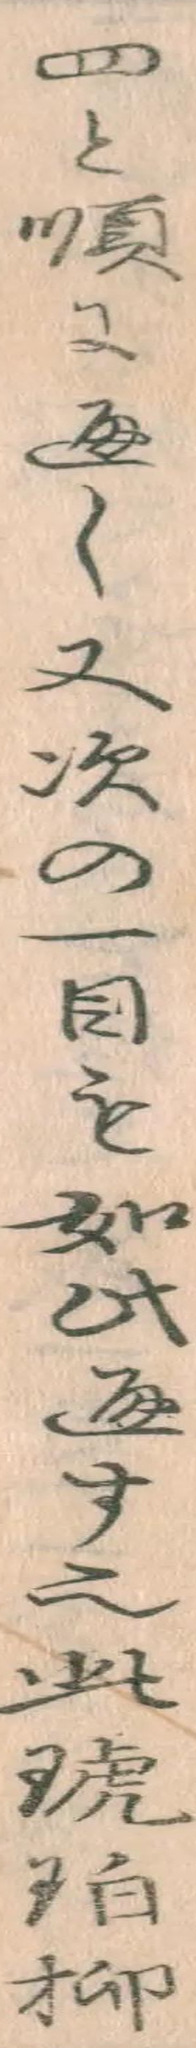四と順に通し又次の一目を如此通す也此琥珀柳
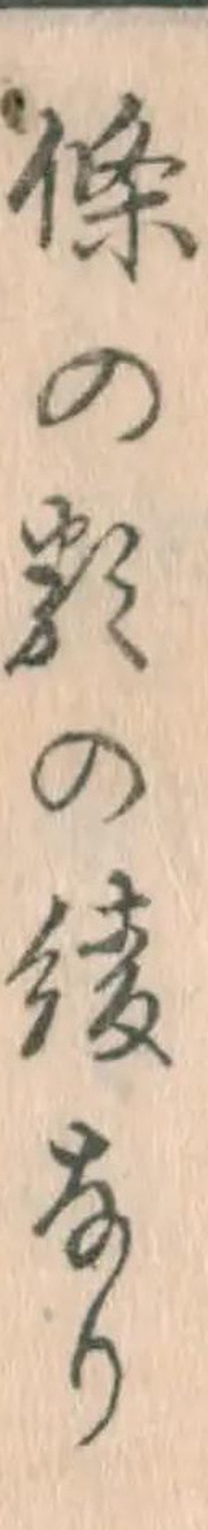条の類の綾なり
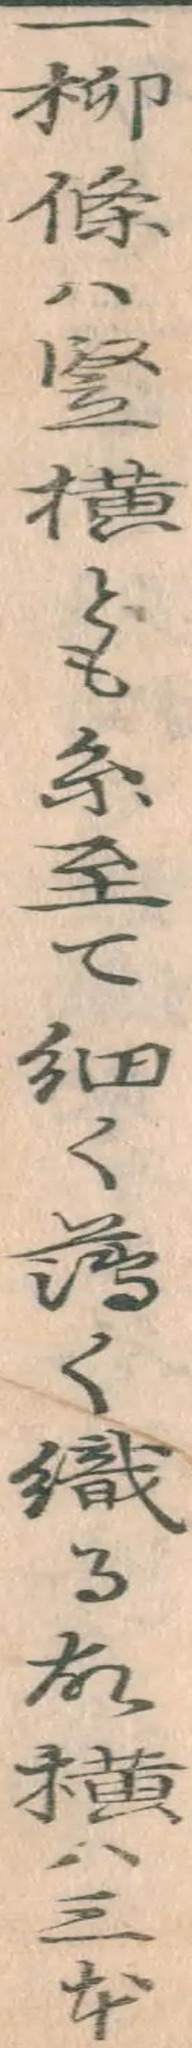一柳条は竪横とも糸至て細く薄く織る故横は三本
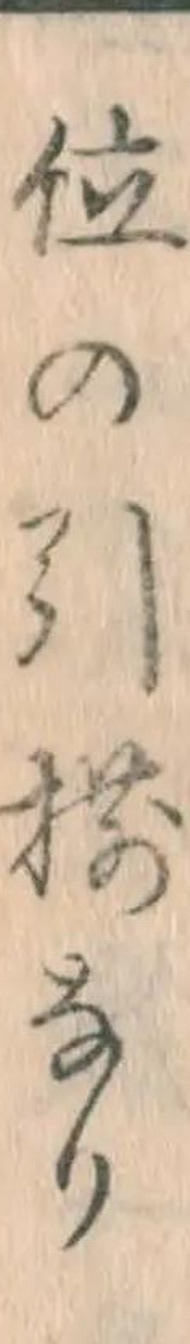位の引揃なり
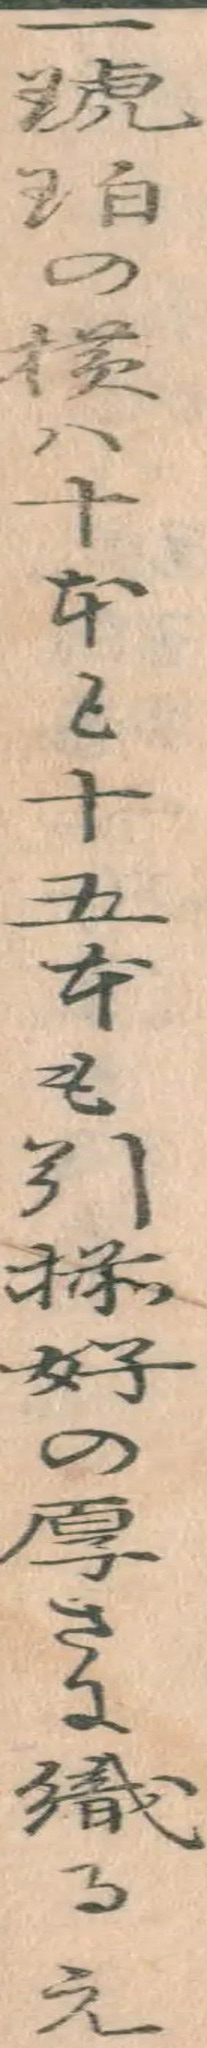一琥珀の横は十本も十五本も引揃好の厚さに織る元

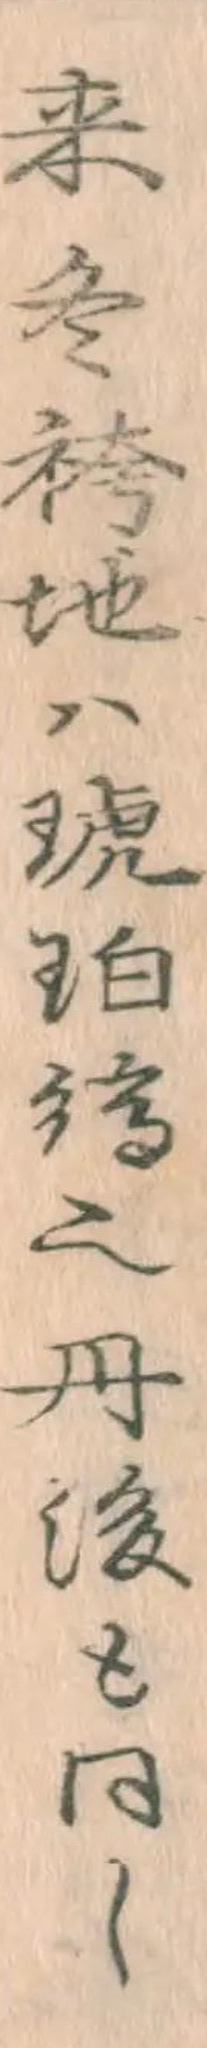来冬袴地は琥珀縞也丹後も同し
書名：機織彙編 5巻. [2]
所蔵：国立国会図書館 National Diet Library, JAPAN
